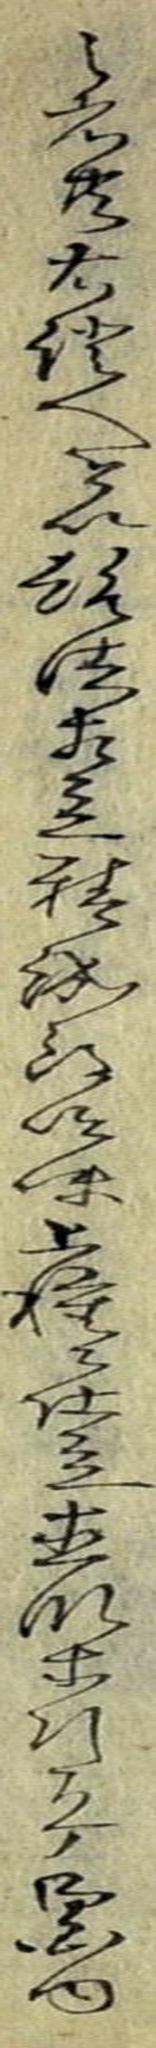之者共右証人を以趣法相立精誠致吟味上種ニ仕立直段等引下ケ御国内
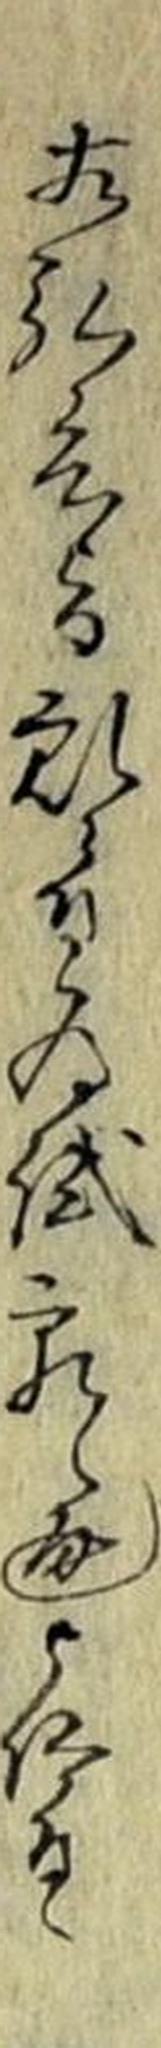相弘度旨願ニ付為試願之通被仰付候
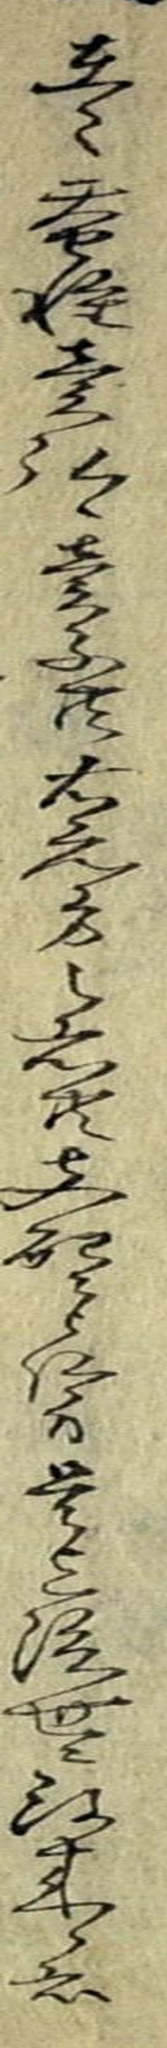一在々蚕売弘候売子共右元方之者共支配ニ被仰付是迄渡世ニ致来候者
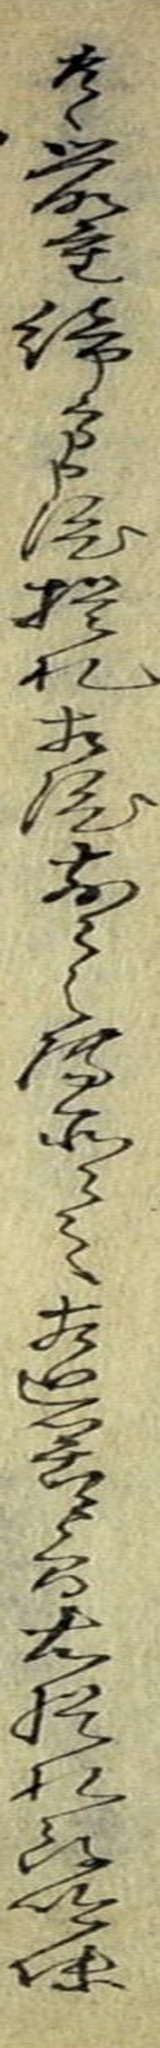共へ厳重締方申渡提札相渡前々之場所々々へ相廻筈ニ候間右提札致吟味
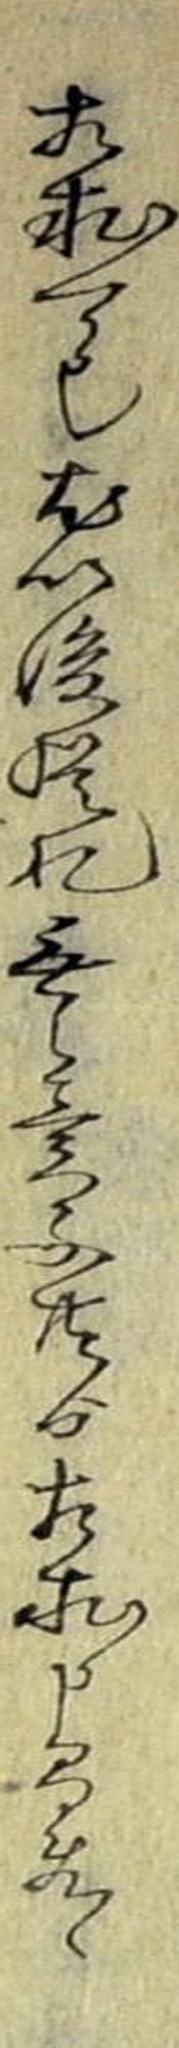相求可申候尤以後提札無之売子共ゟ相求申間敷候
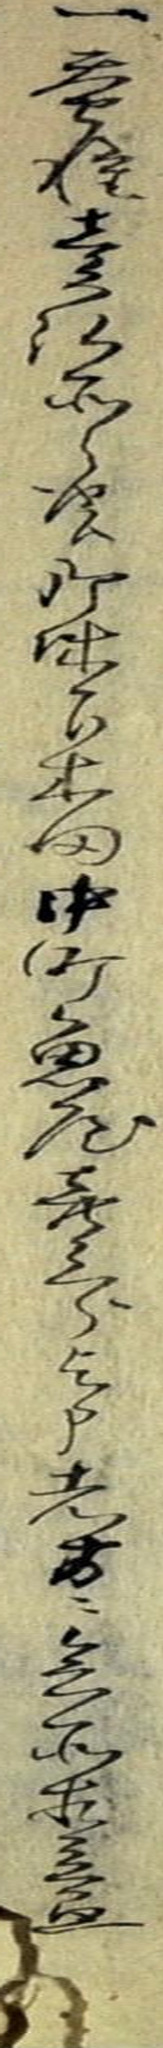一蚕種売弘所之儀ハ御城下木田中町魚屋喜三郎与申者方ニ会所相立置
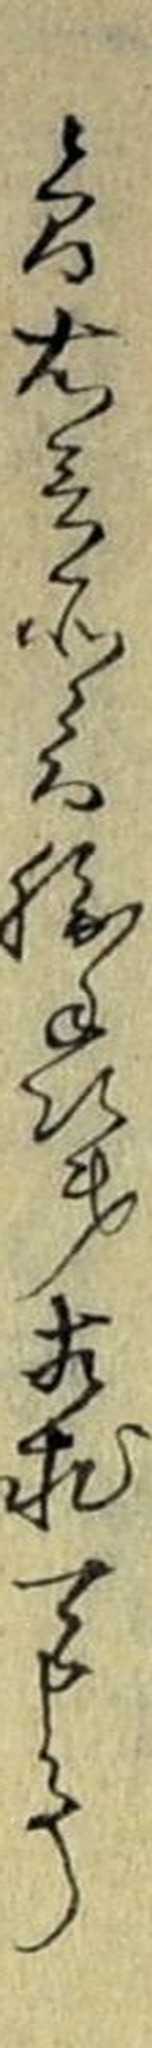候間右会所ニ而勝手次第相求可申事
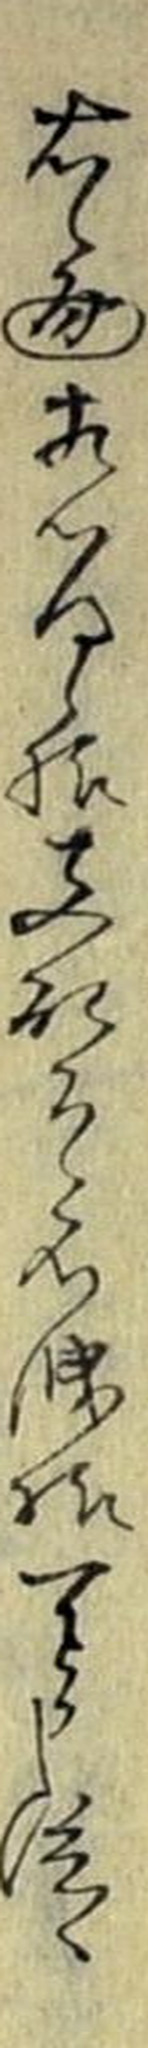右之通相心得候様支配下へ不洩様可被申渡候
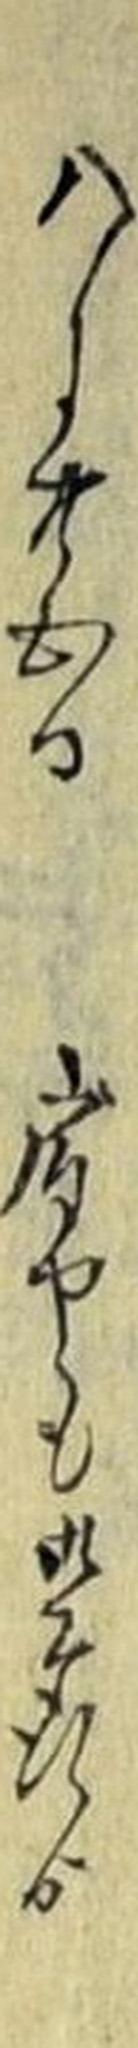八月廿五日府中へも御奉行ゟ
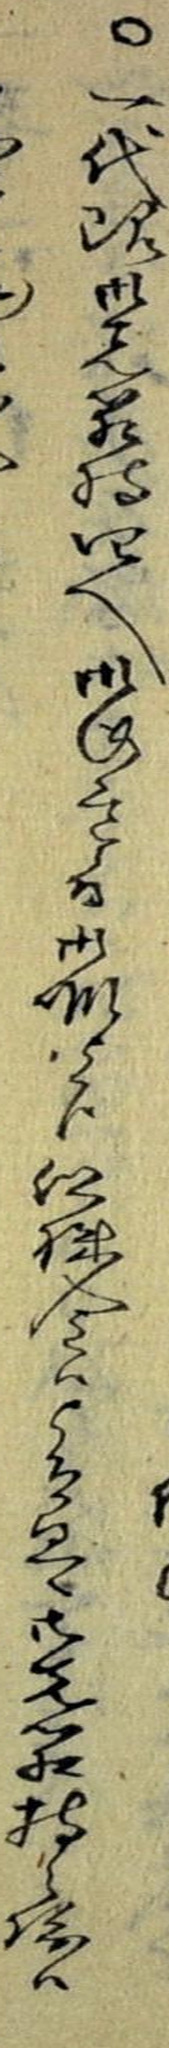○一代限御先箱持四人御趣意ニ付御暇被下組株金ハ被下置候御先箱持之儀ハ
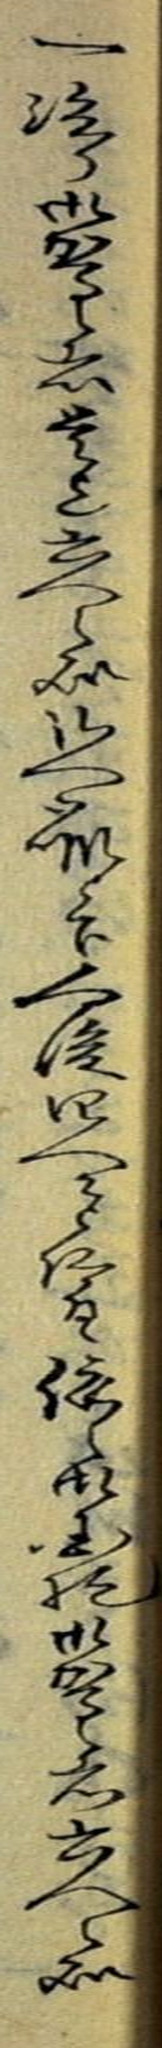一渡り御駕之者是迄六人之処弐人御暇被下向後四人ニ被仰付候依之御国抱御駕之者六人之処
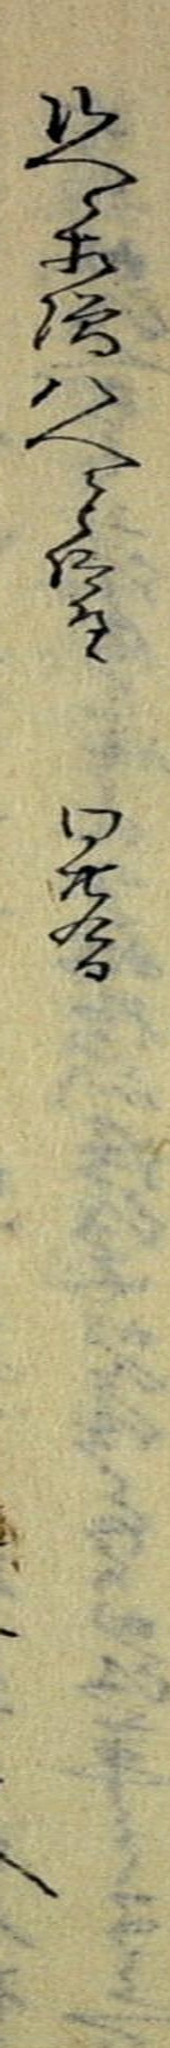弐人へ相増八人ニ被仰付候同廿九日
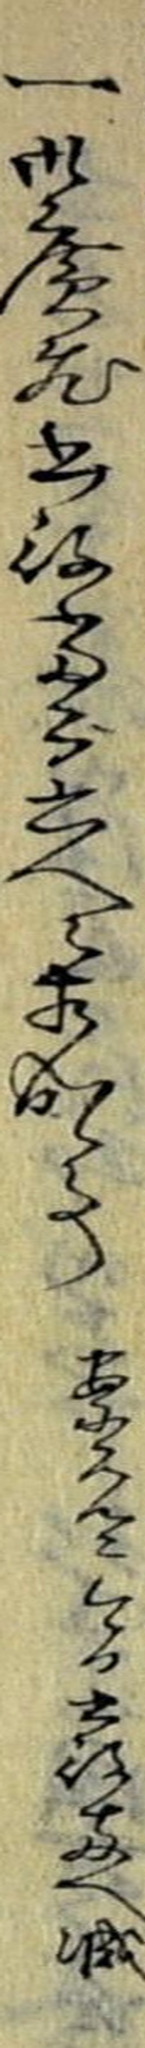一御広敷書役当分六人ニ相成候事案スルニ今日書役両人減
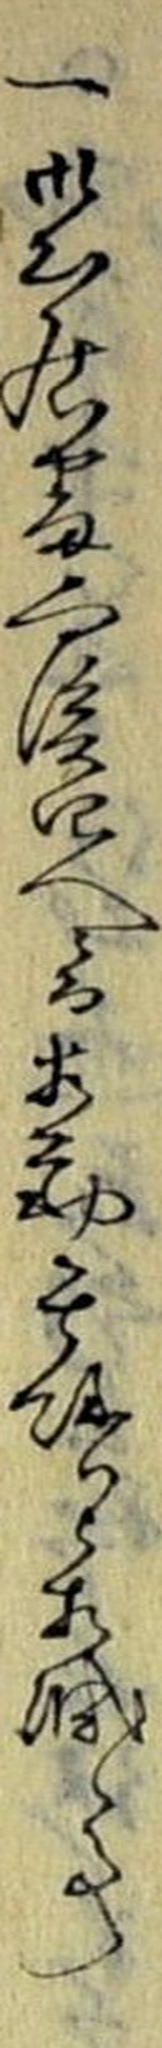一御出居番向後四人ニ而相勤其余ハ被相減候事
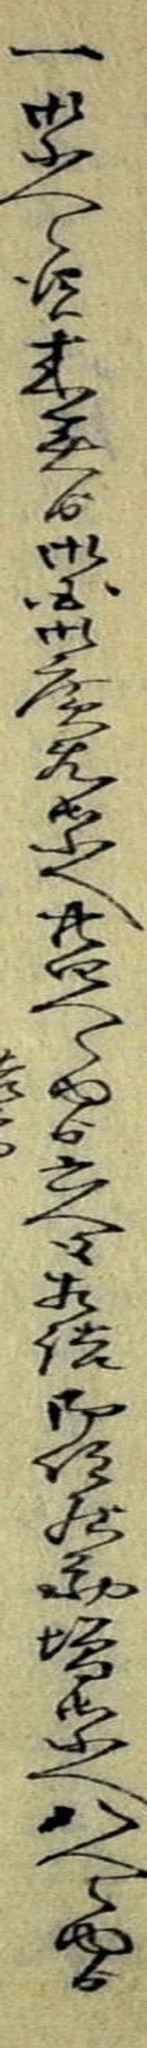一御小人之儀ハ来年ゟ御国御広敷御小人共廿四人之内ゟ六人ツヽ相詰御住居勤増御小人八人之内ゟ
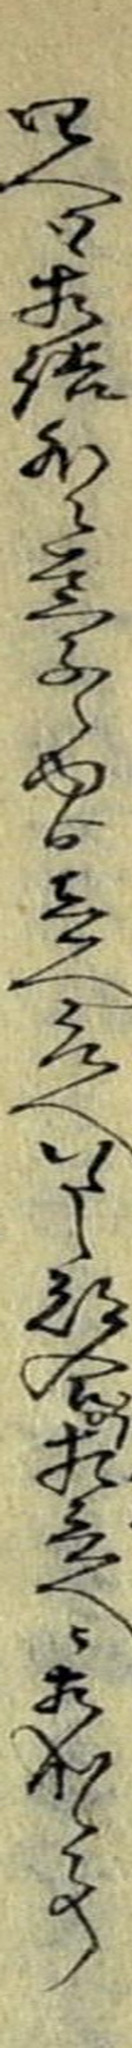四人ツヽ相詰外ニ荒子之内ゟ壱人取人いたし都合詰高拾壱人被相成候事
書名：命令之部 五
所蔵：福井県文書館 Fukui Prefectural Archives
